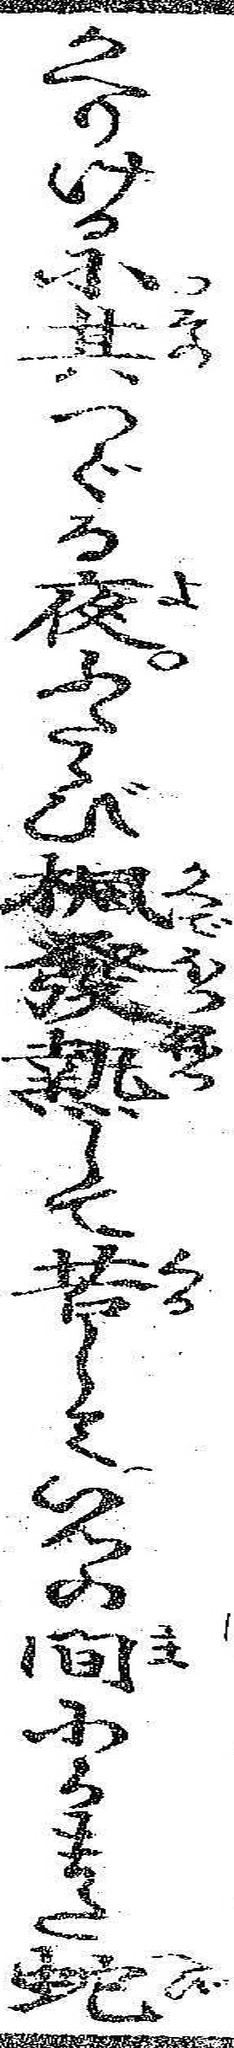かへりけるに。其つぐる夜。ふたゝび楓発熱して苦しみ。いつの間にかまた蛇
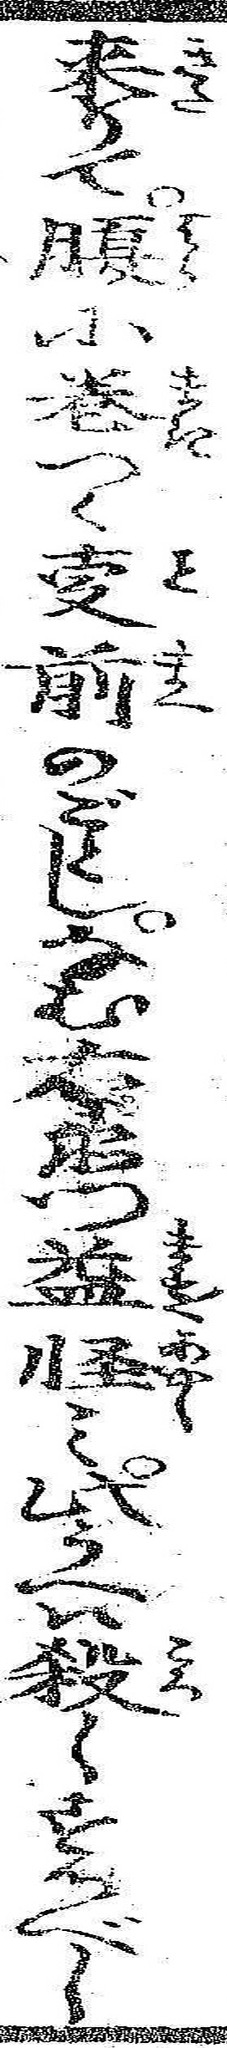来りて。腹に巻つく事前のごとし。なむ右衛門益怪み。此うへは殺しすつべし
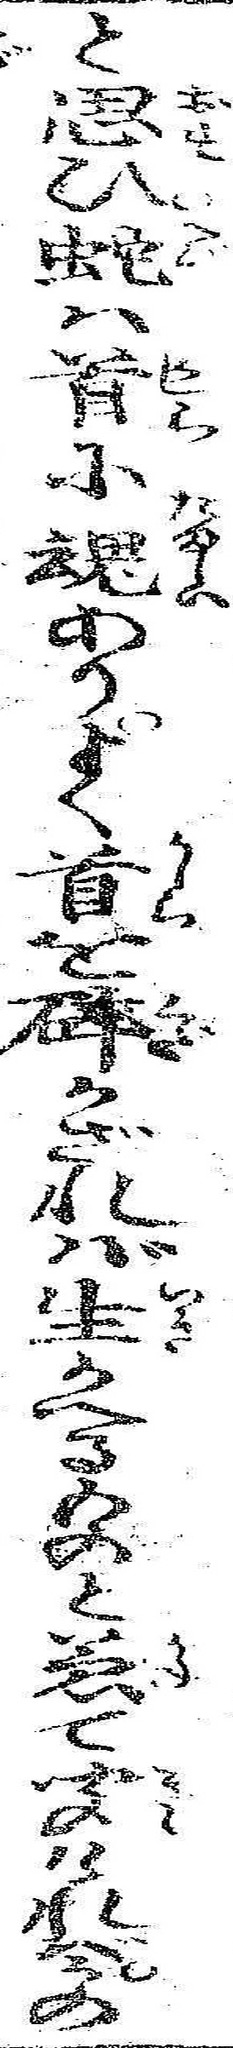と思ひ。蛇は首に魂あり。よく首を砕かざれば生かへるものと兼て聞ければ。かの
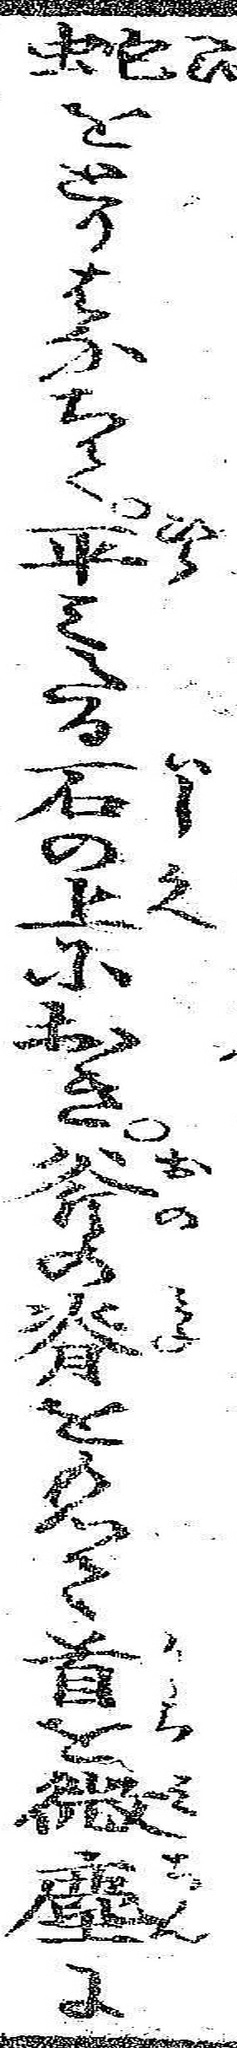蛇をとりはなちて。平みたる石の上におき。斧の脊をもつて首を微塵に
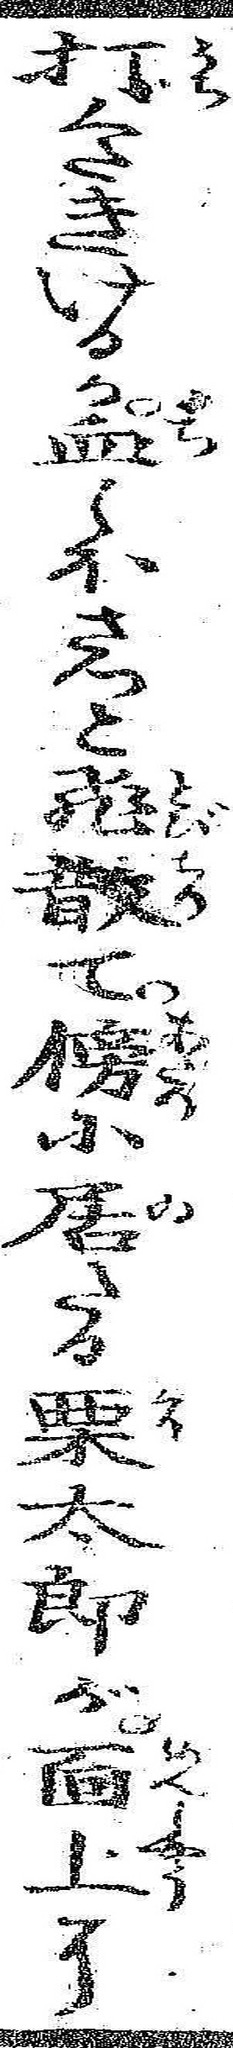打くたきけるか。血しほさつと飛散て。傍に居たる栗太郎が。面上に

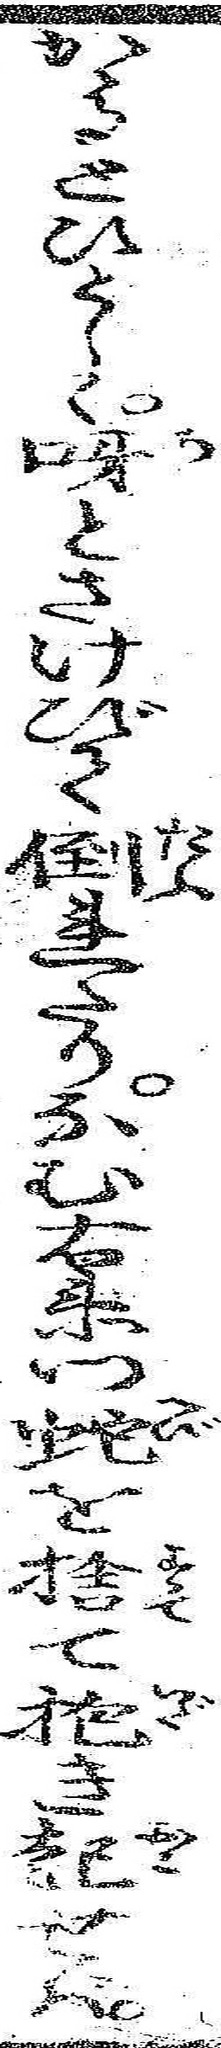かゝるとひとしく。呀とさけびて倒れたり。なむ右衛門蛇を捨て抱き起せば
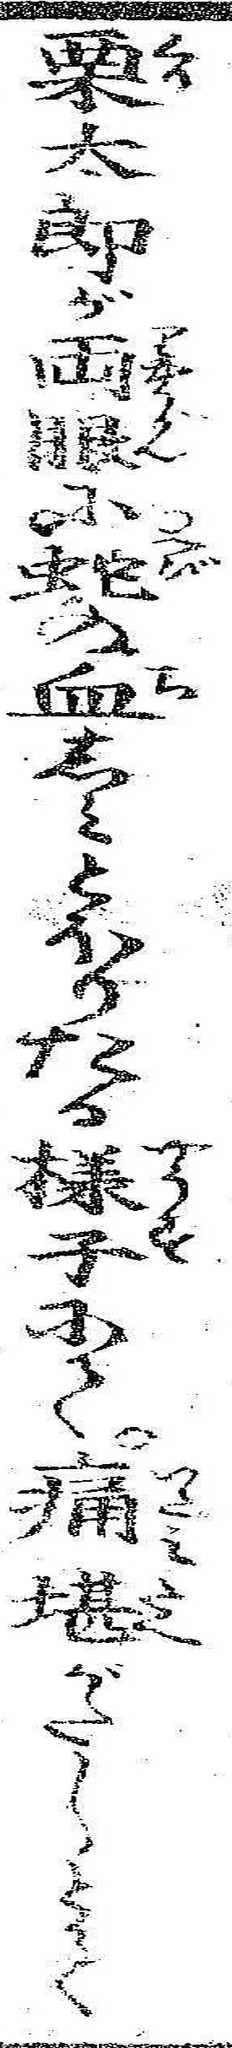栗太郎が両眼に。蛇の血しみとほりたる様子にて。痛堪がたしとて
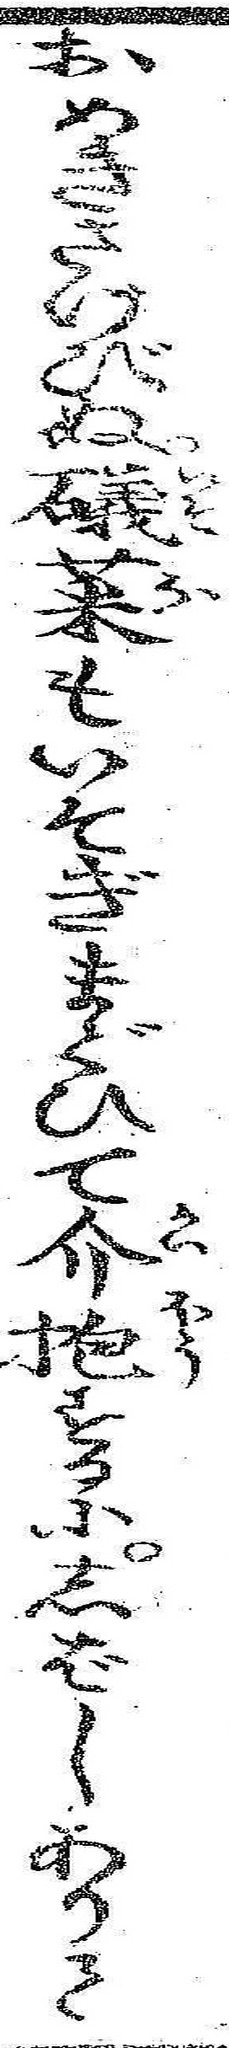おめきさけびぬ。礒菜もいそぎまどひて介抱するに。しばしありて
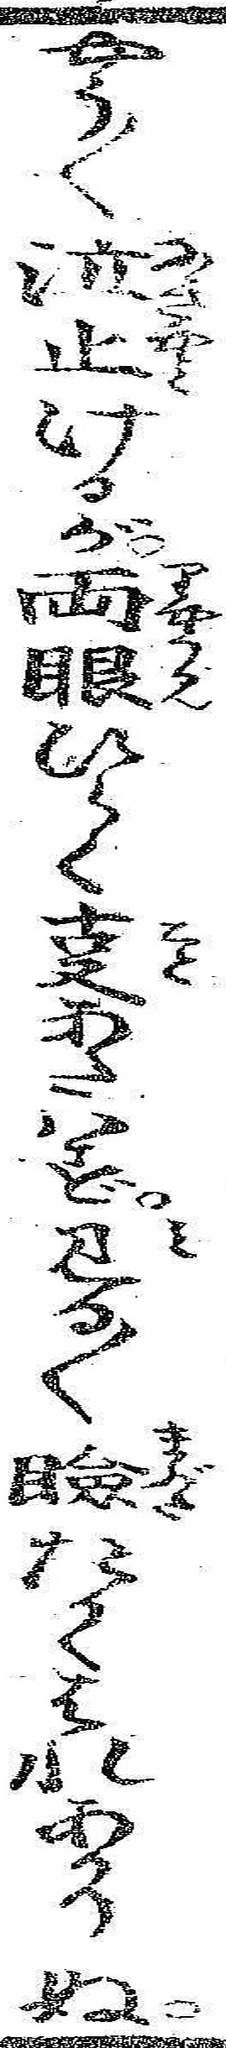やう〳〵泣止けるが。両眼ひらく事あたはず。見る〳〵瞼たかくはれあかりぬ。
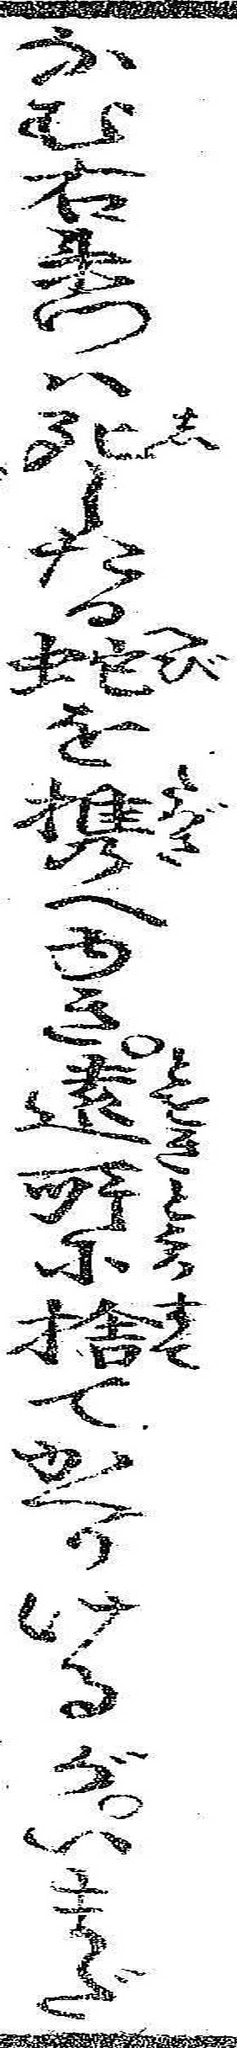なむ右衛門は死したる蛇を携へゆき。遠所に捨てかへりけるが。いまだ
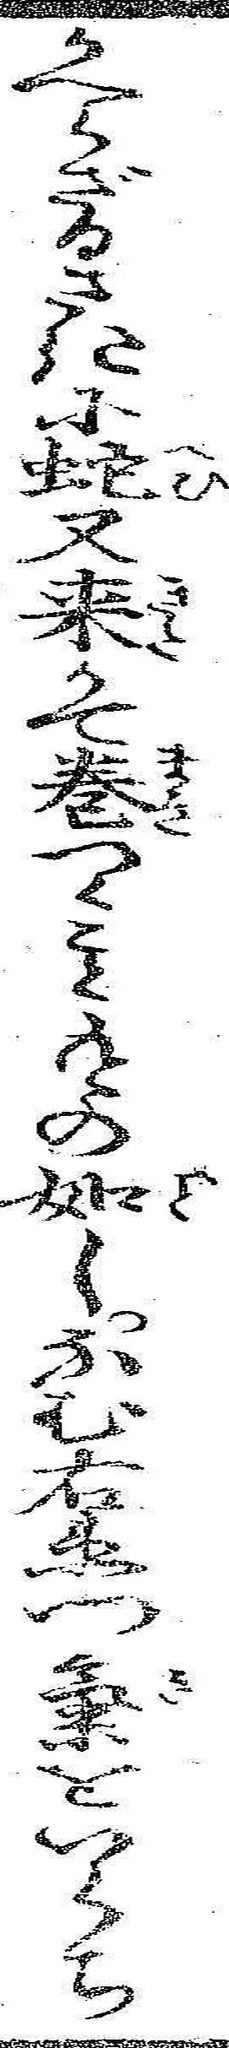かへらざるさきに蛇又来りて巻つくこともとの如し。なむ右衛門気をいらち
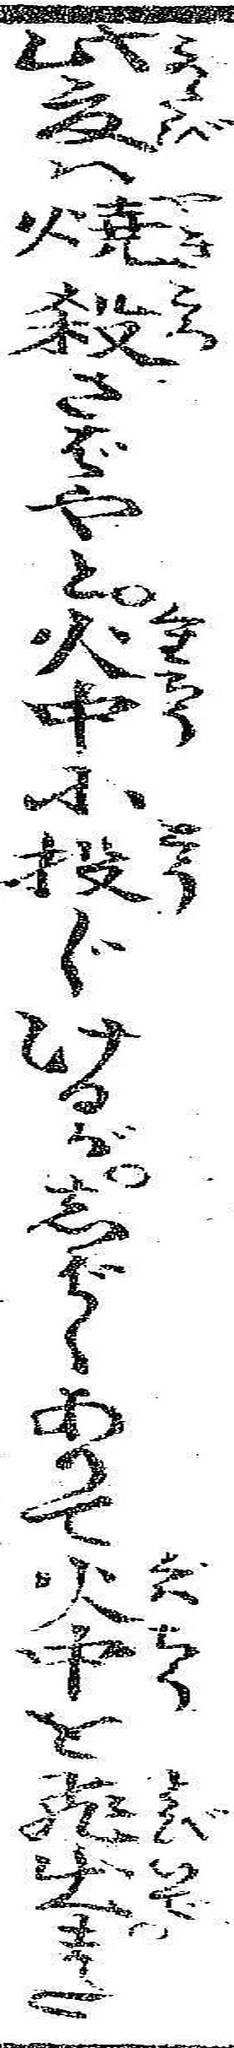此度は焼殺さばやと。火中に投じけるが。しばしありて火中を飛出。また
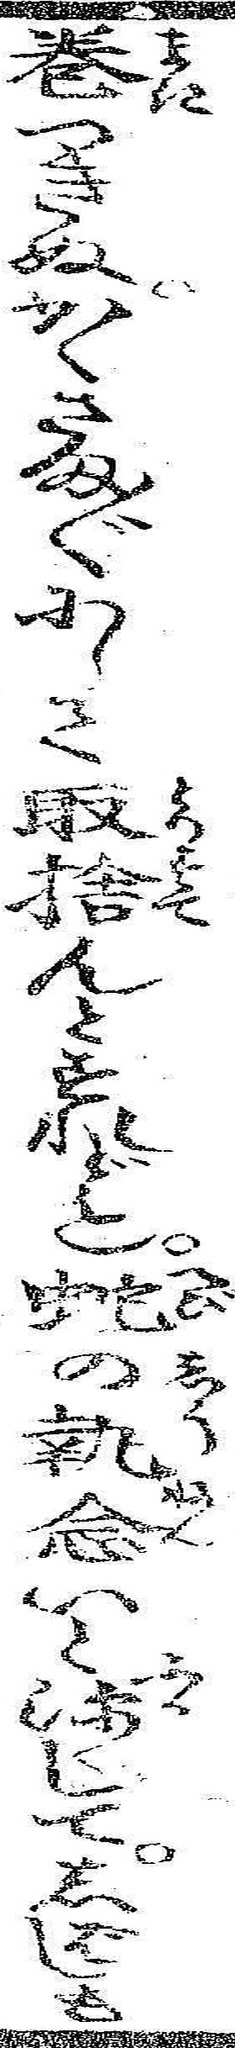巻つきぬ。かくさま〴〵にして取捨んとすれども。蛇の執念いと深くして。しばしも
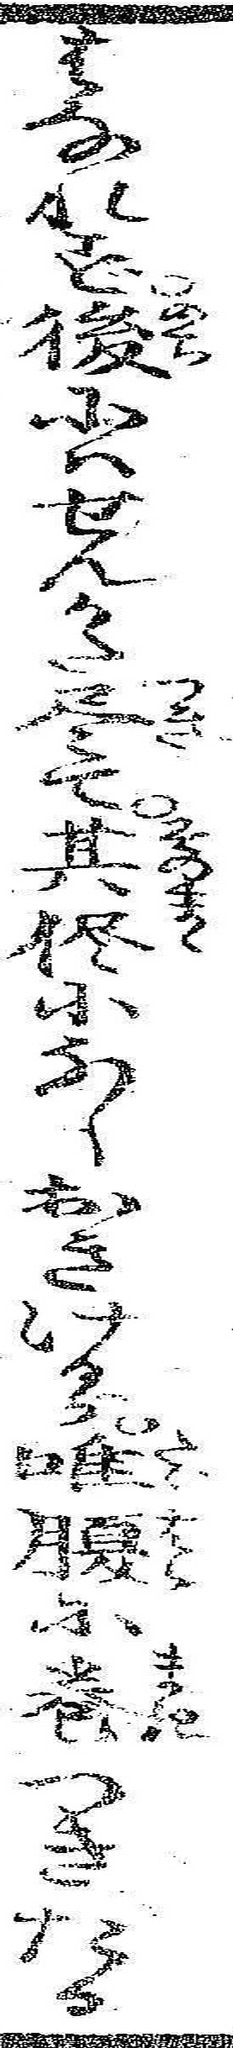はなれず。後にはせんかた尽て。其侭になしおきけるが。唯腹に巻つきたる
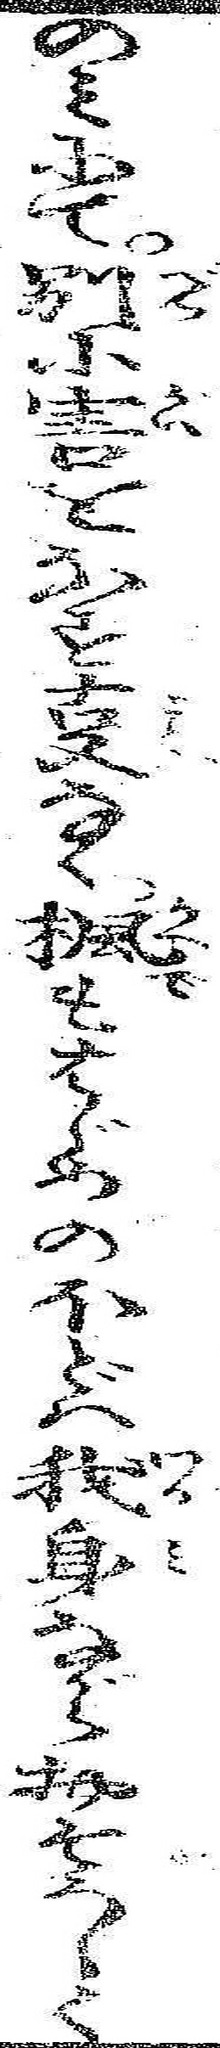のみにて。別に害をなす事なく。楓もはじめのほどは我身ながらおそろしく
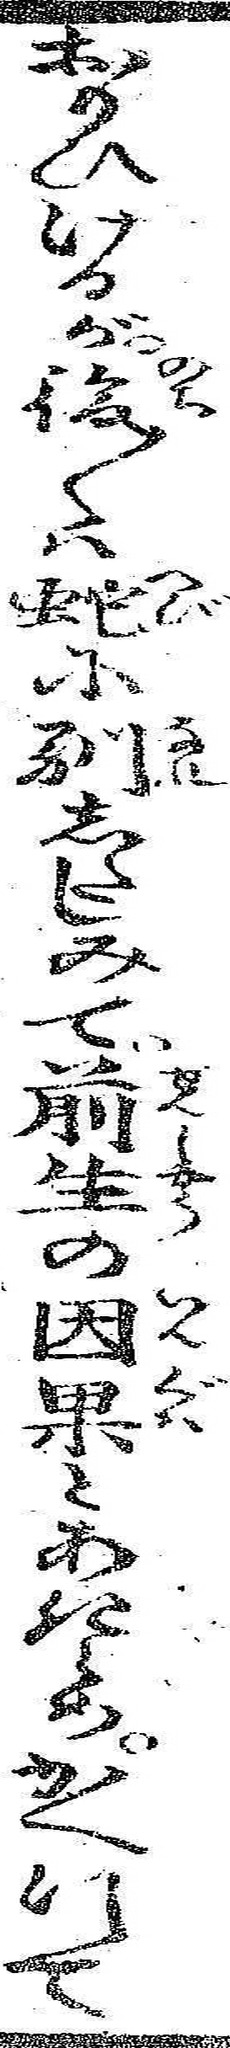おもひけるが。後々は蛇に馴したしみて。前生の因果とあきらめ。かへつて
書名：昔話稲妻表紙
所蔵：国文学研究資料館
